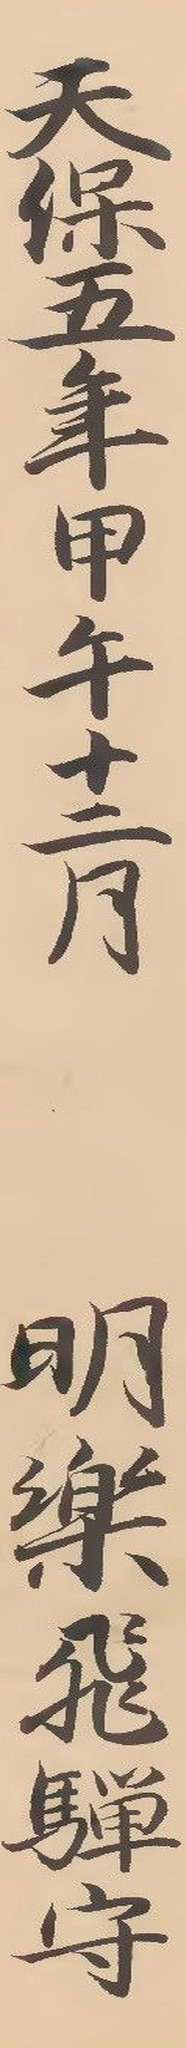天保五年甲午十二月明楽飛騨守
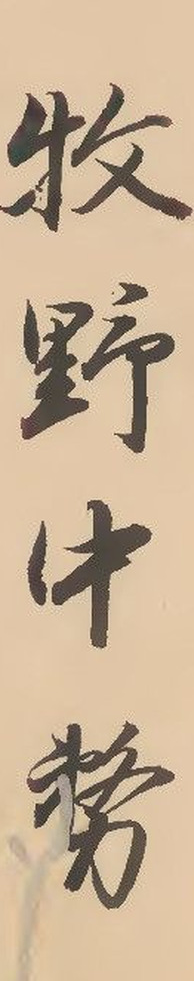牧野中務
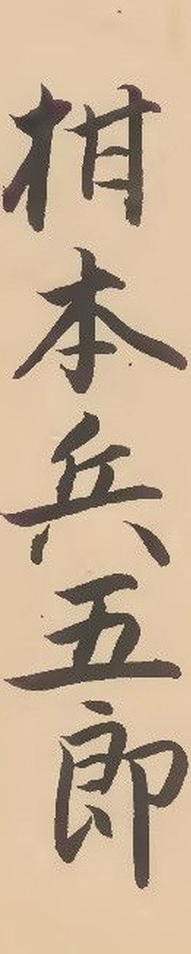柑本兵五郎
